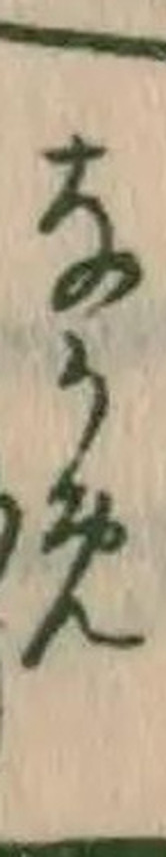なかめ
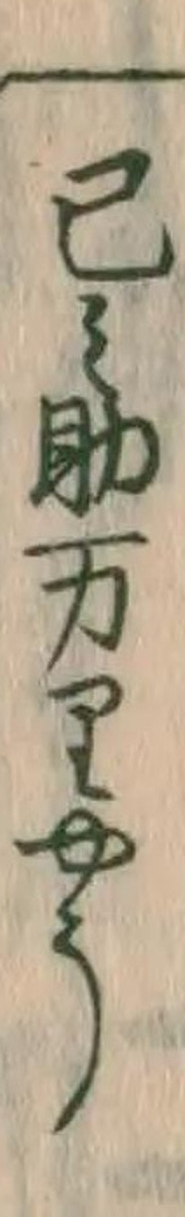巳之助万りやう
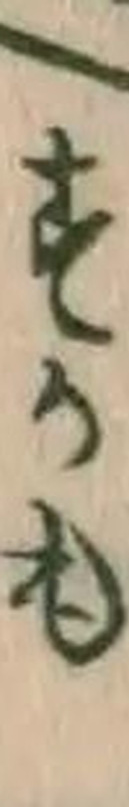すかも
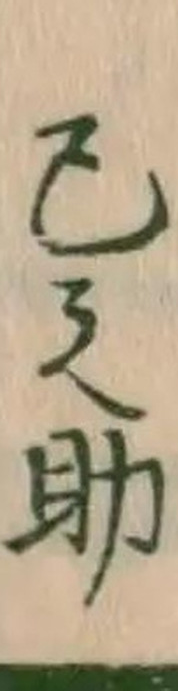巳之助
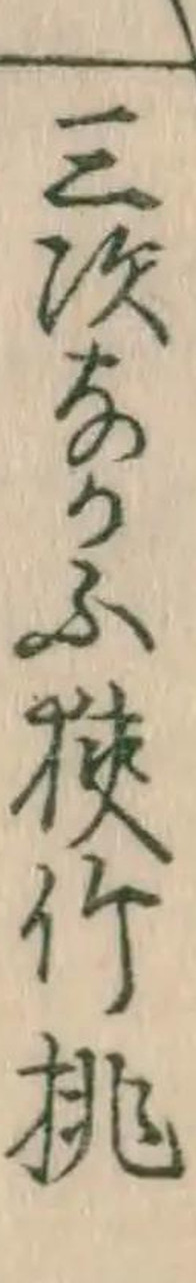三次なかふ狹竹桃
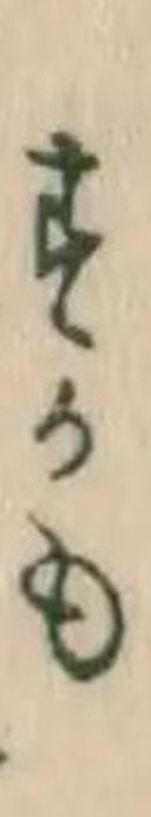すかも
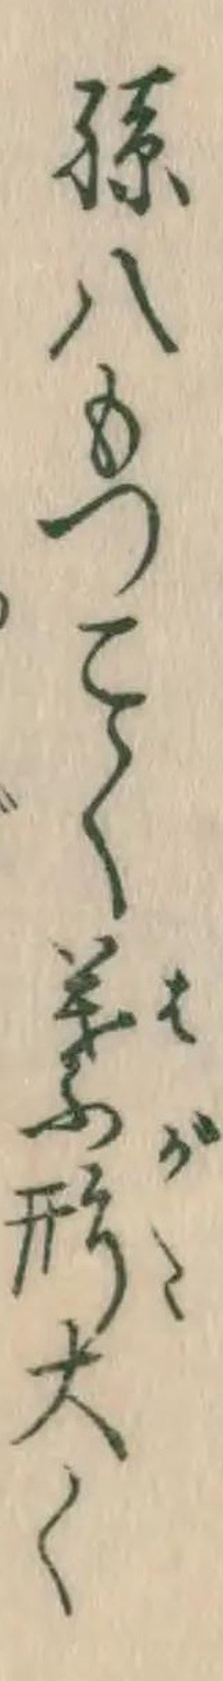孫八もつこく葉形大く
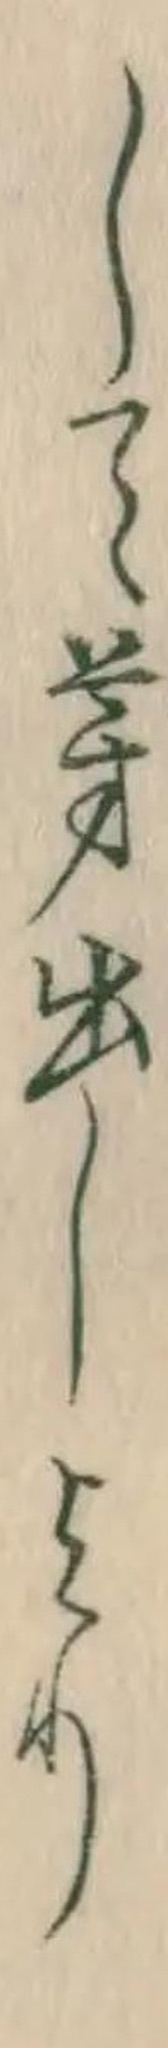して芽出しより
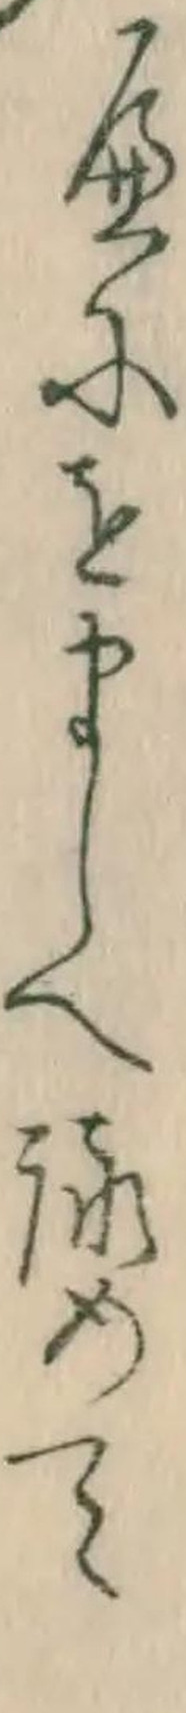へにをましへ詠めて
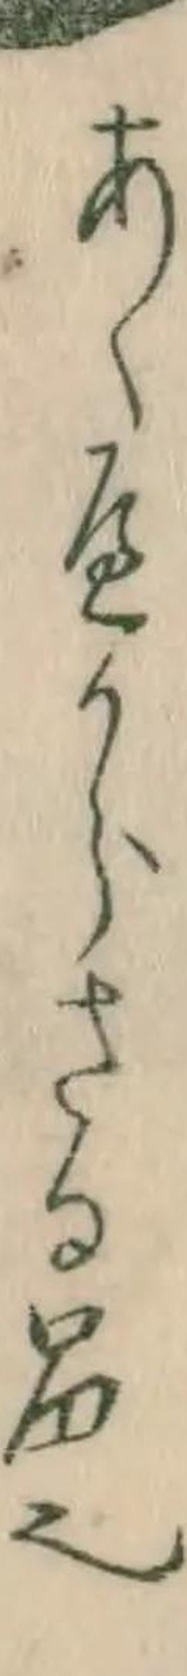あくへからさる品也
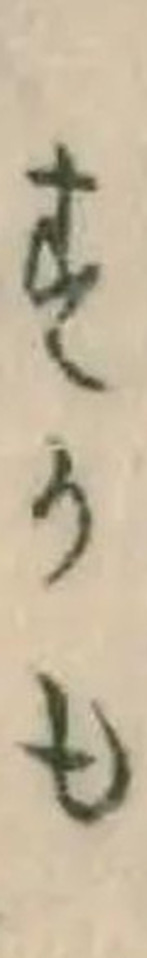すかも
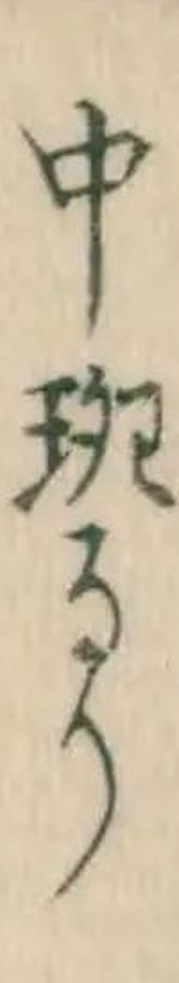中斑るり
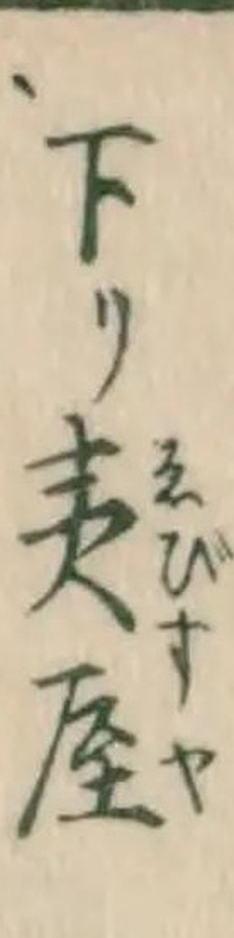下り夷屋
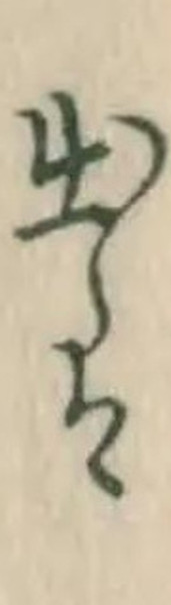出しは
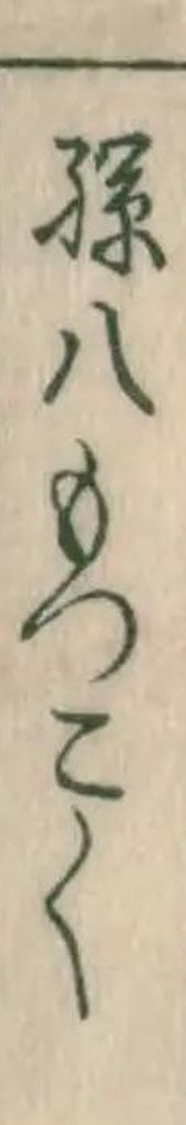孫八もつこく
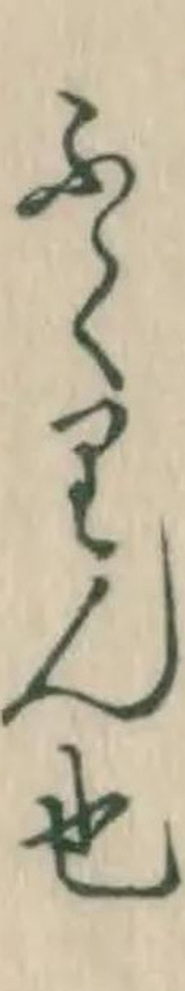ふくりん也
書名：草木奇品家雅見 3巻. [3]
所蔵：国立国会図書館 National Diet Library, JAPAN
